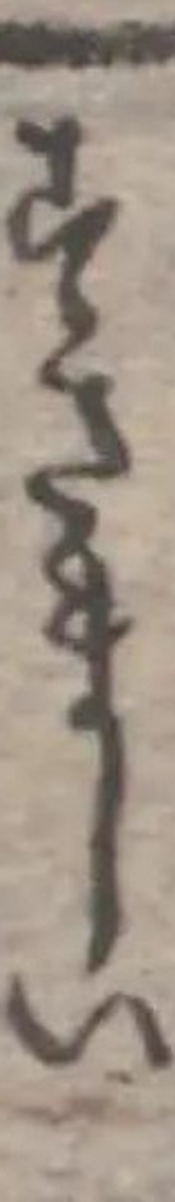すさましい
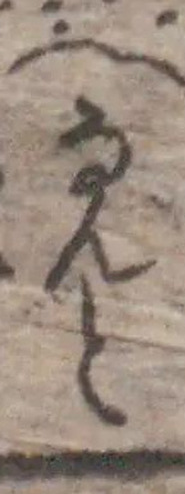なんと
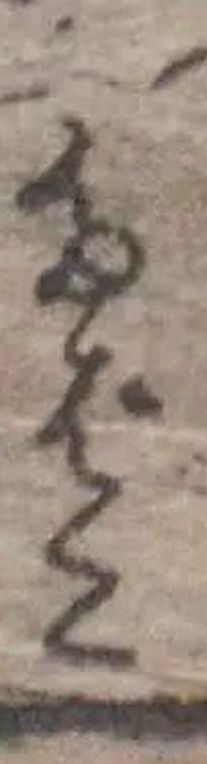たばこ
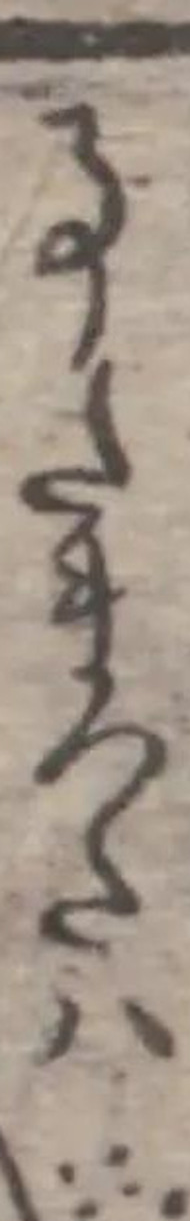事たまつたは
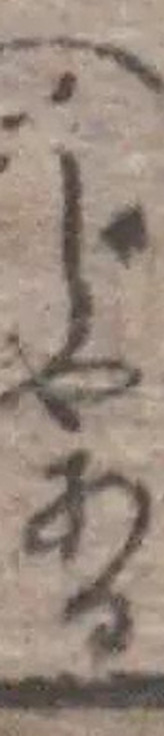じやある
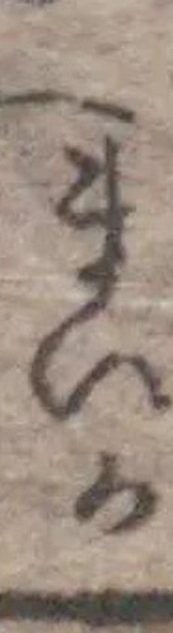まいか

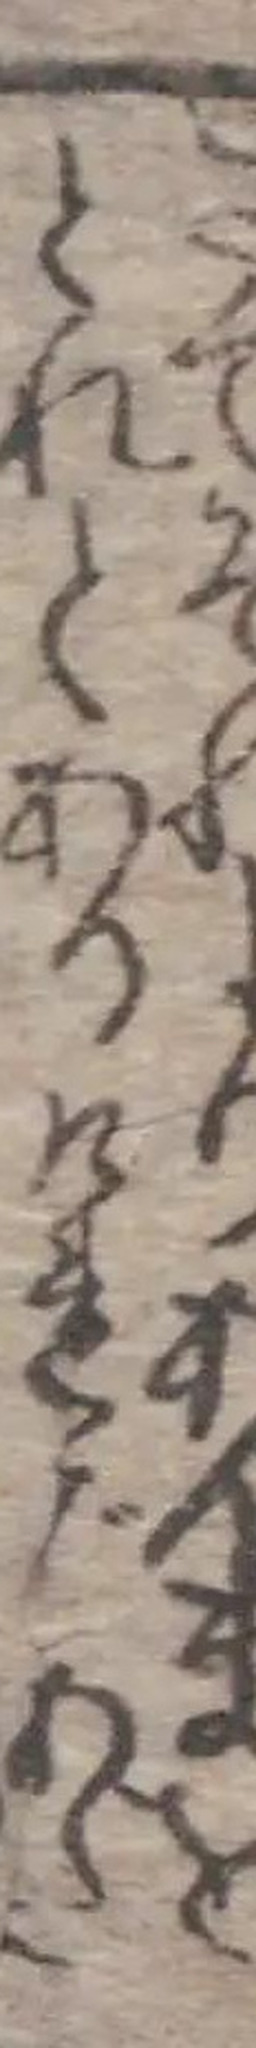とれとありければあた
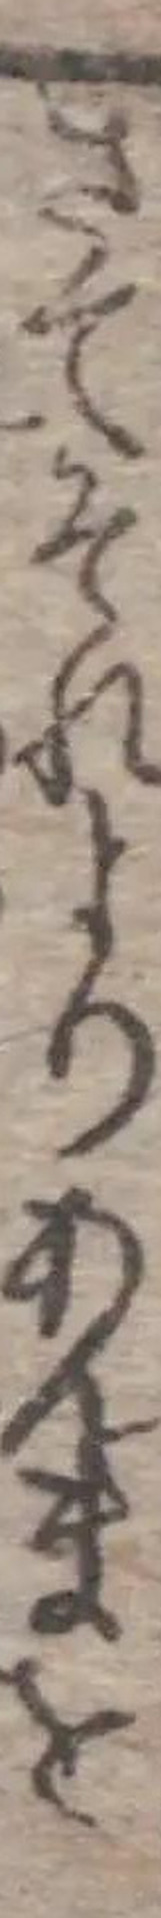さてそれよりあんまを
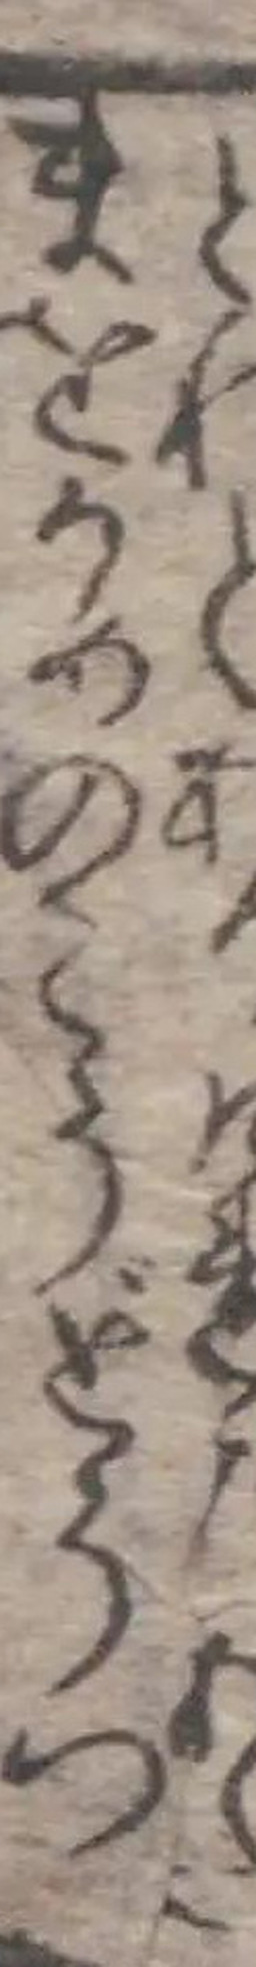まをかめのこうどうつ
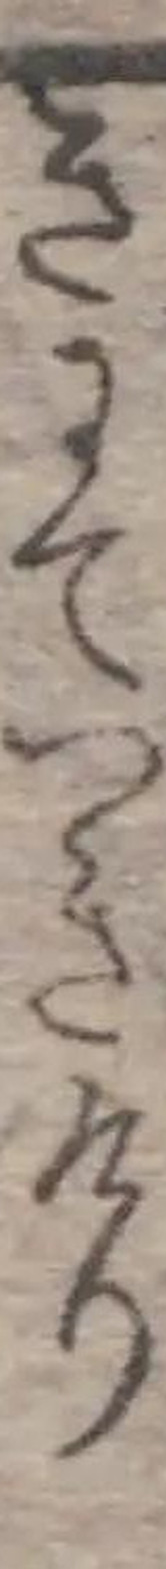きにてつきけり
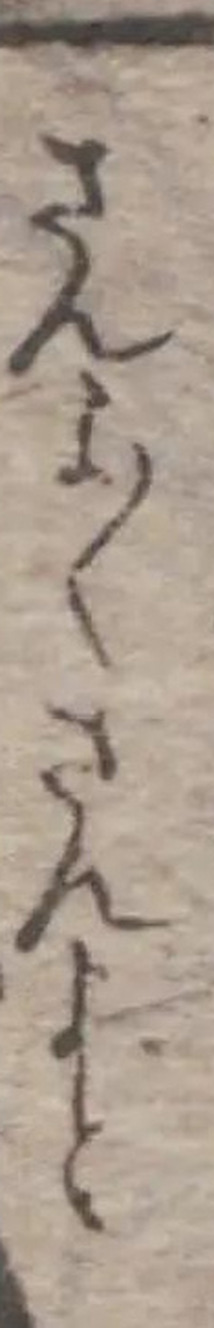さんよ〳〵さんよとな
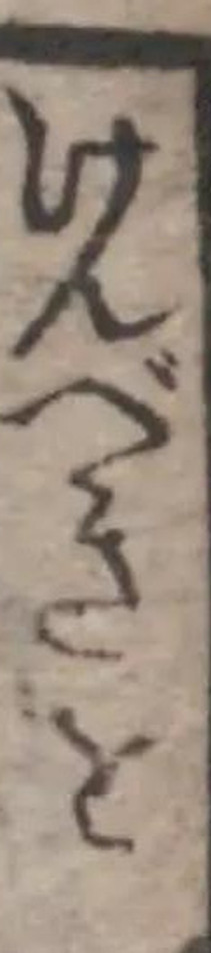けんべきを
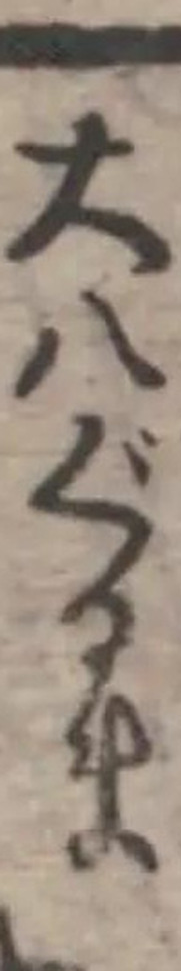大八ぐるま
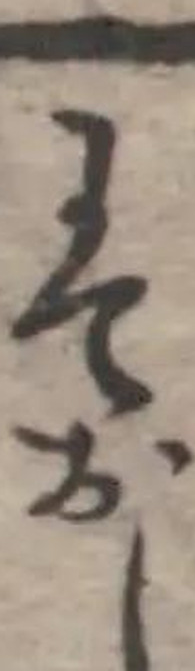にておし
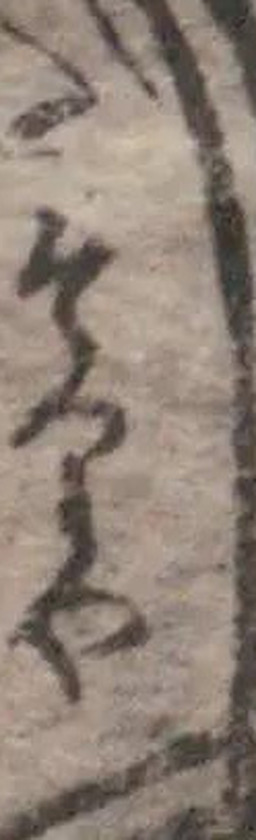そりや
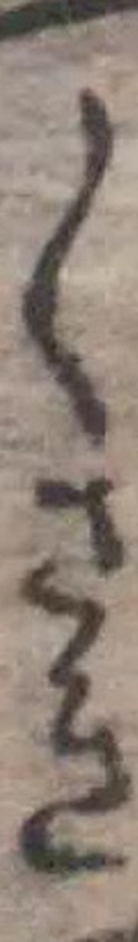〳〵さき
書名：五たいそう
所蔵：国立国会図書館 National Diet Library, JAPAN
